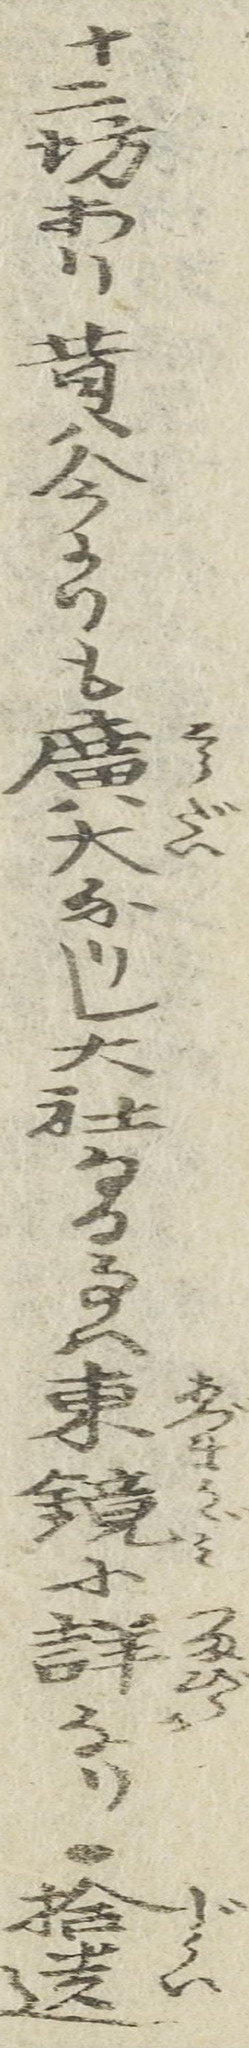十二坊あり昔は今よりも広大なりし大社なる事は東鏡に詳なり●拾遺
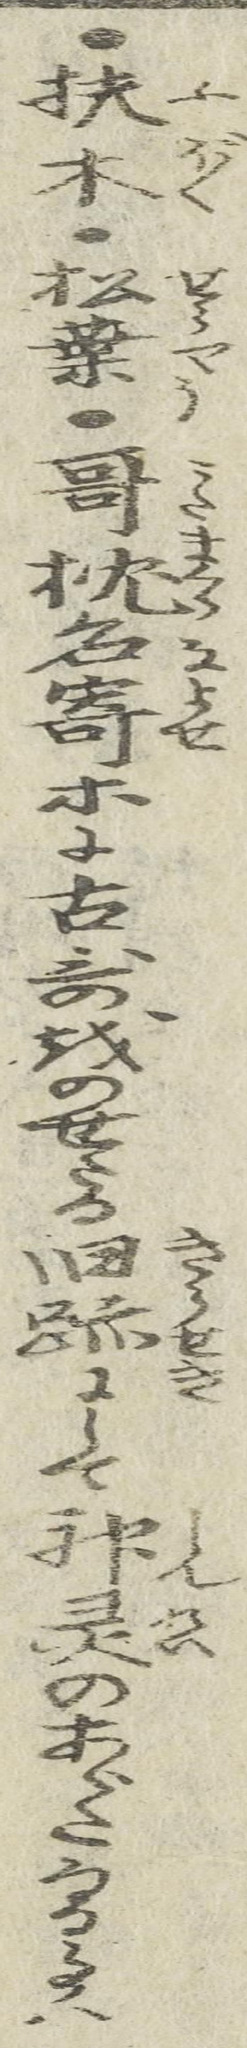●扶木●松葉●歌枕名寄等に古歌をのせたる旧跡にして神霊のあらたなる事は
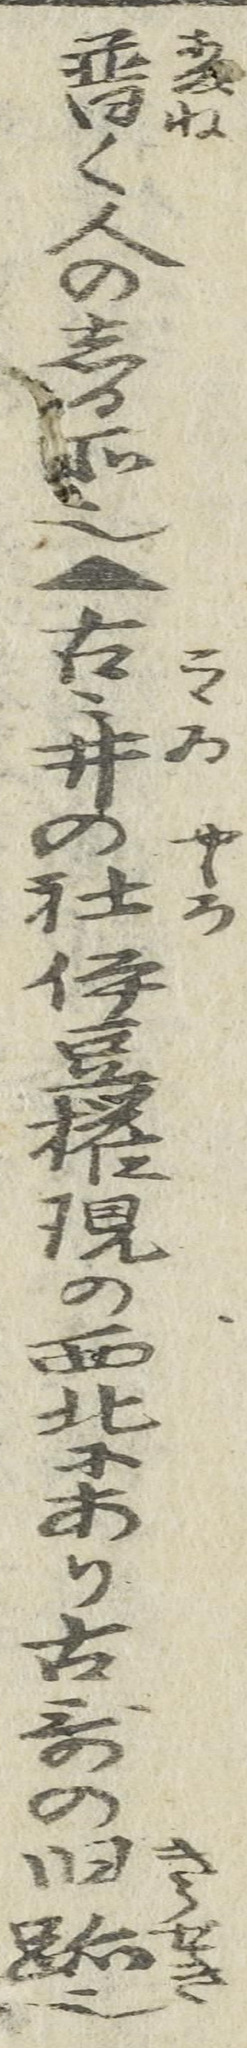普く人のしる所也▲古々井の社伊豆権現の西北にあり古歌の旧跖也
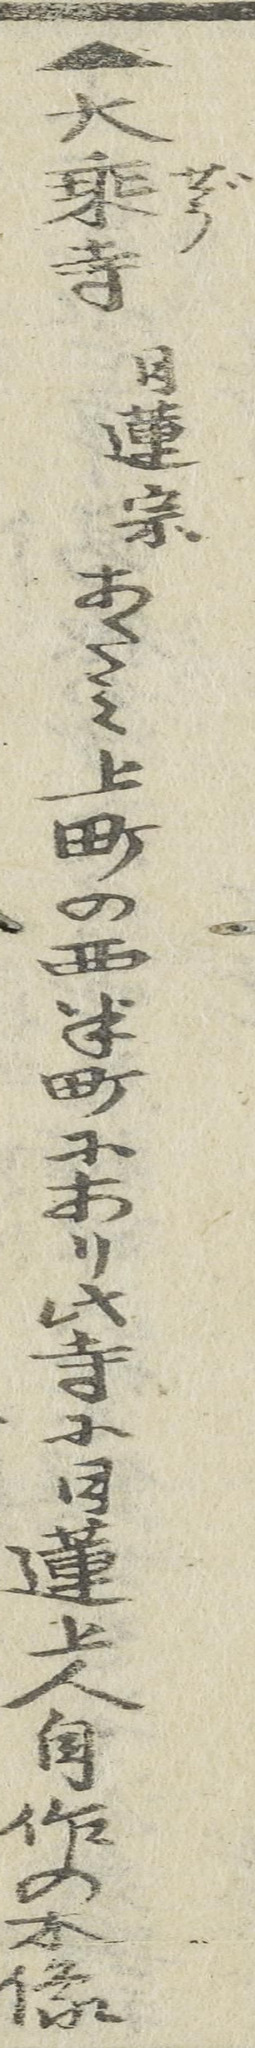▲大乗寺日蓮宗あたみ上町の西半町にあり此寺に日蓮上人自作の木像
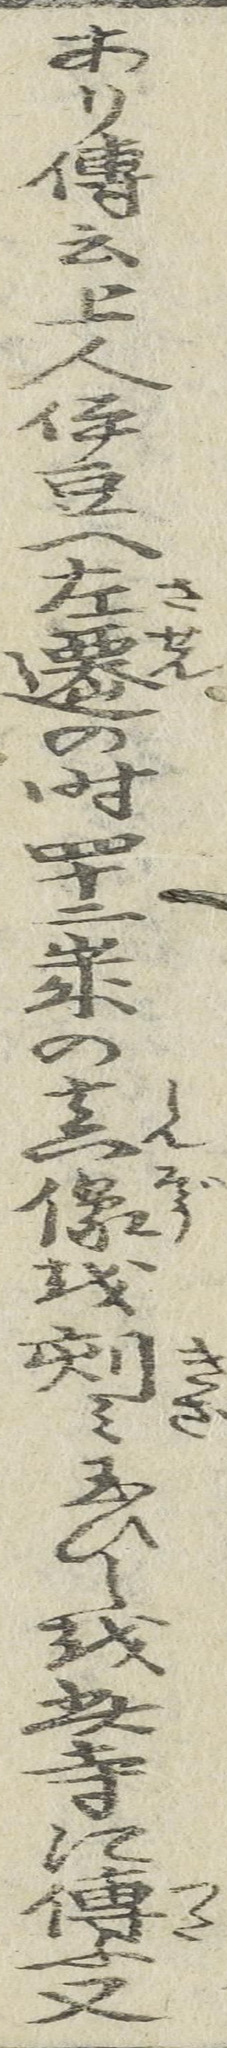あり伝云上人伊豆へ左遷の時四十二歳の真像を刻み玉ひしを此寺に伝ふ又
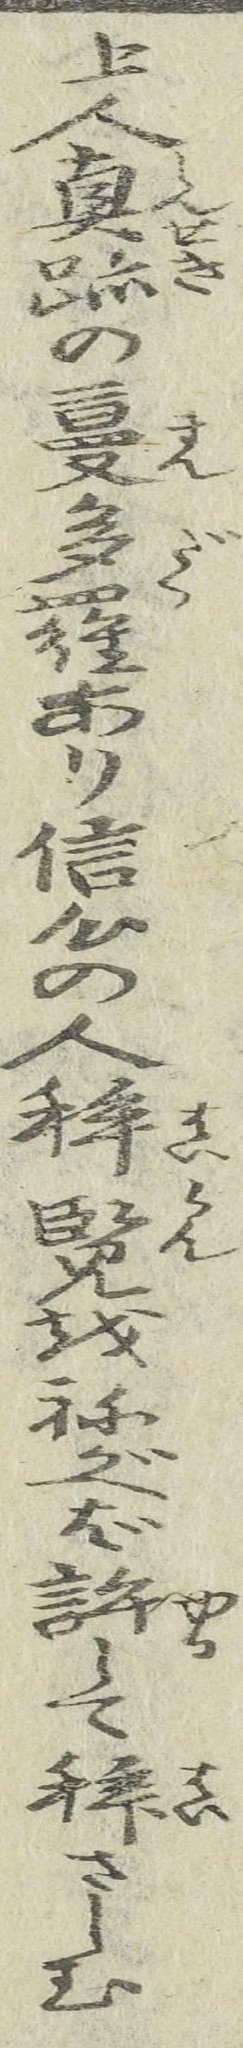上人真跡の曼多羅あり信心の人拝覧をねがへば許して拝さしむ
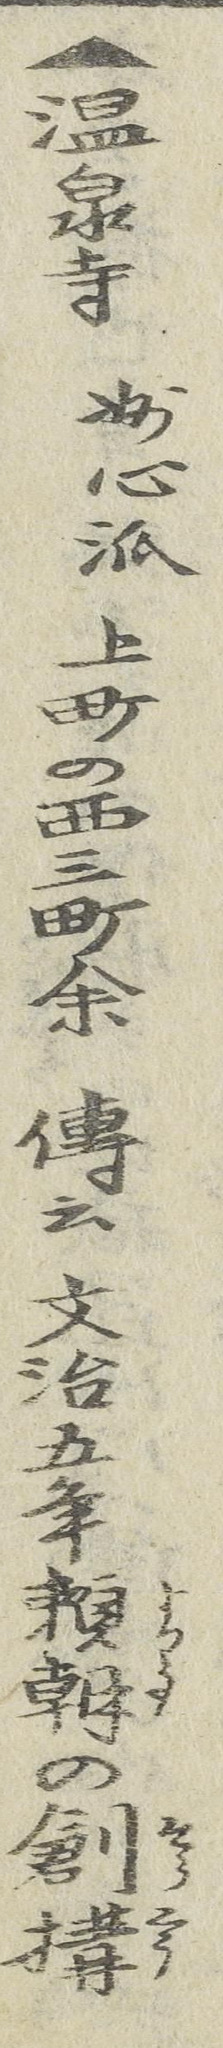▲温泉寺妙心派上町の西三町余伝云文治五年頼朝の創構

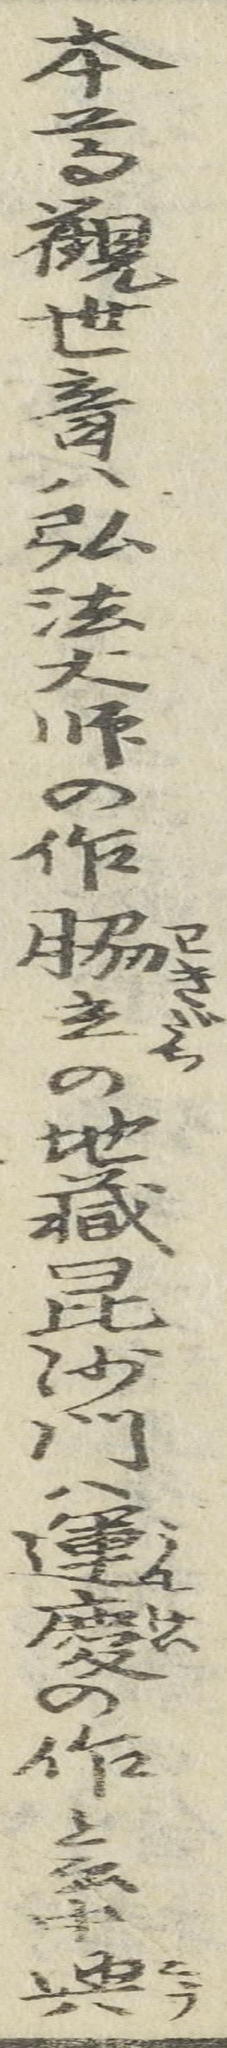本尊観世音は弘法大師の作脇立の地蔵毘沙門は運慶の作と云中興
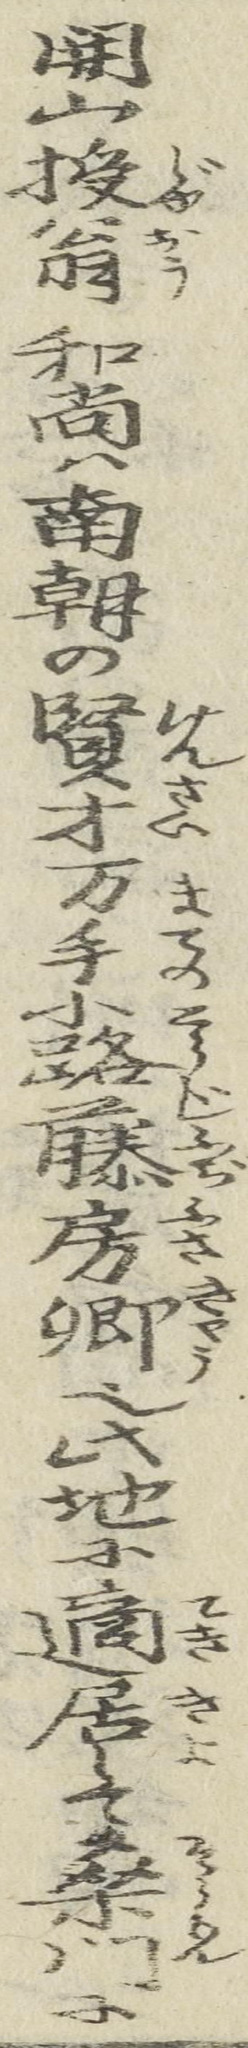開山授翁和尚は南朝の賢才万手小路藤房卿也此地に適居して桑門に
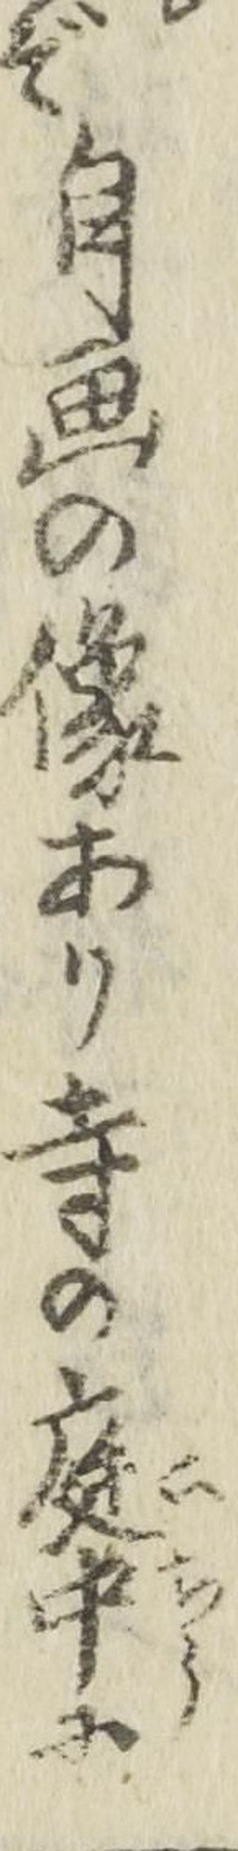自画の像あり寺の庭中に
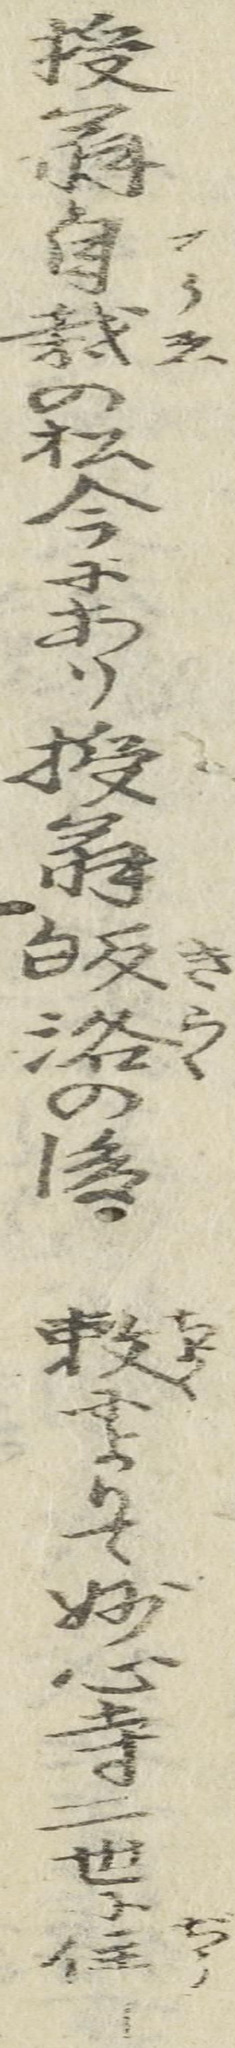授翁自栽の松今にあり授翁皈洛の後勅によりて妙心寺二世に住し
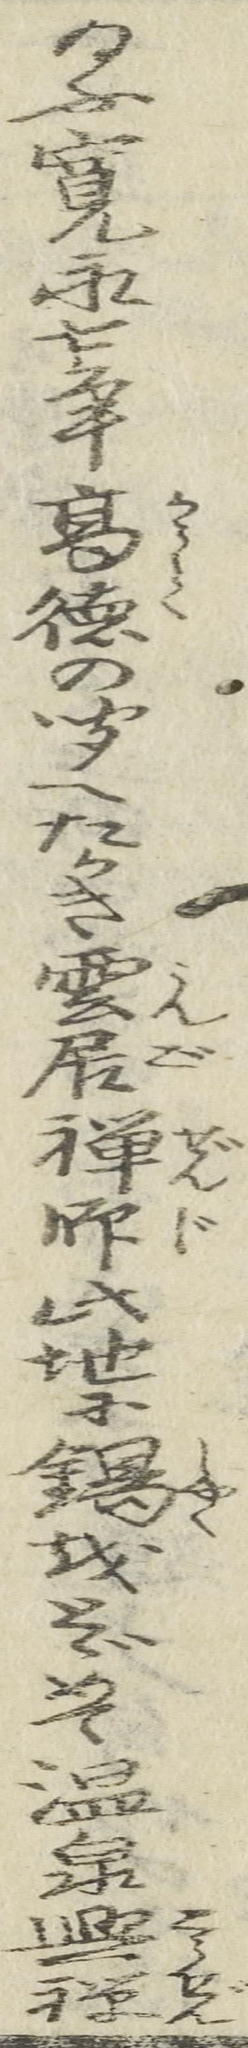給ふ寛永七年高徳の聞へたかき雲居禅師此地に錫をとゞめて温泉興禅
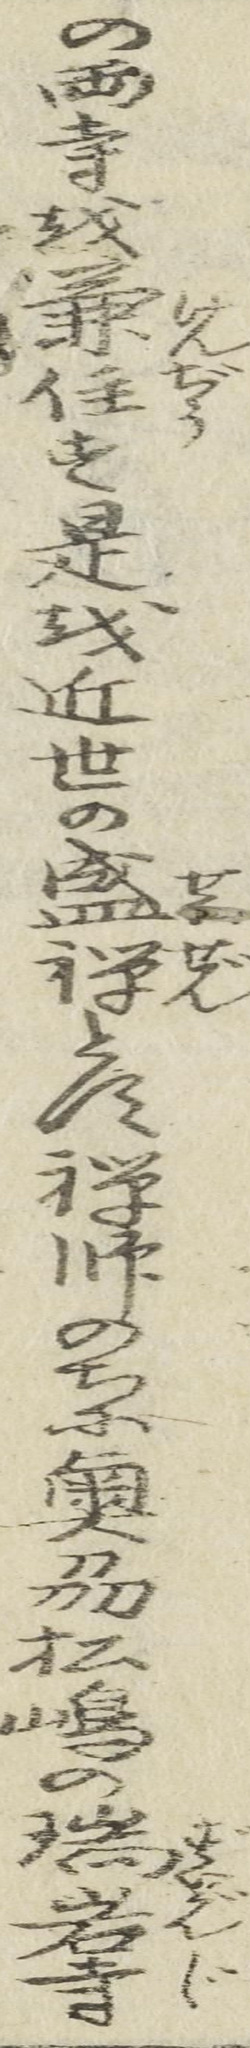の両寺を兼住す是を近世の盛禅とす禅師のちに奥刕松嶋の瑞岩寺
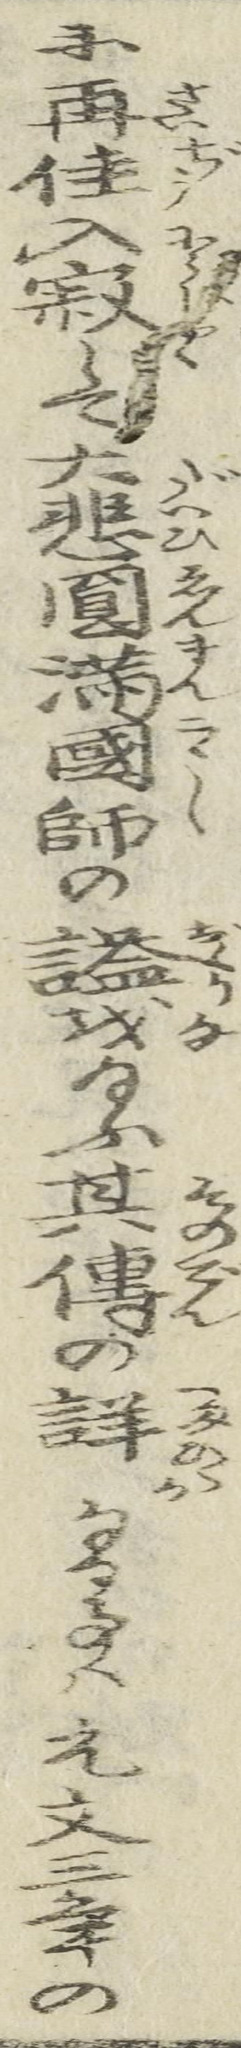に再佳入寂して大悲円満国師の謚を給ふ其伝の詳なるは元文三年の
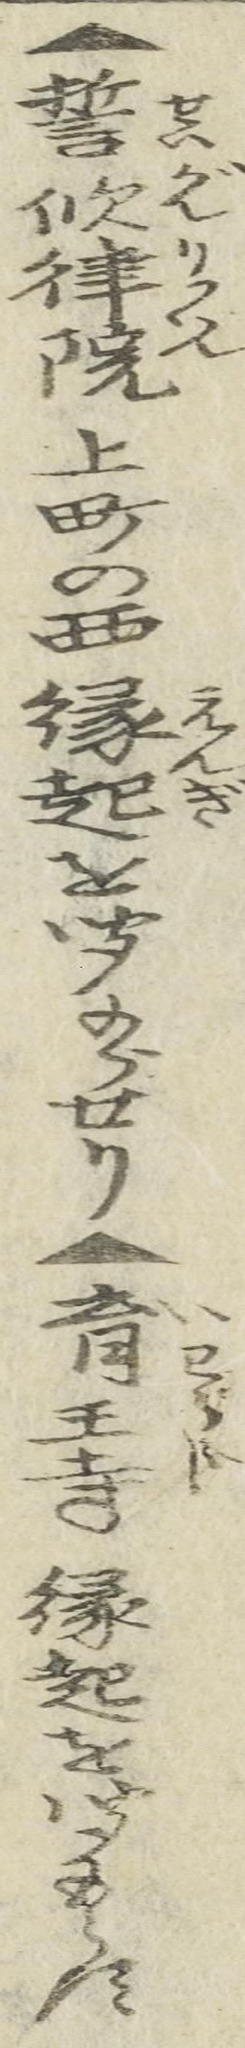▲誓欣律院上町の西縁起を聞もらせり▲育王寺縁起を聞もらす
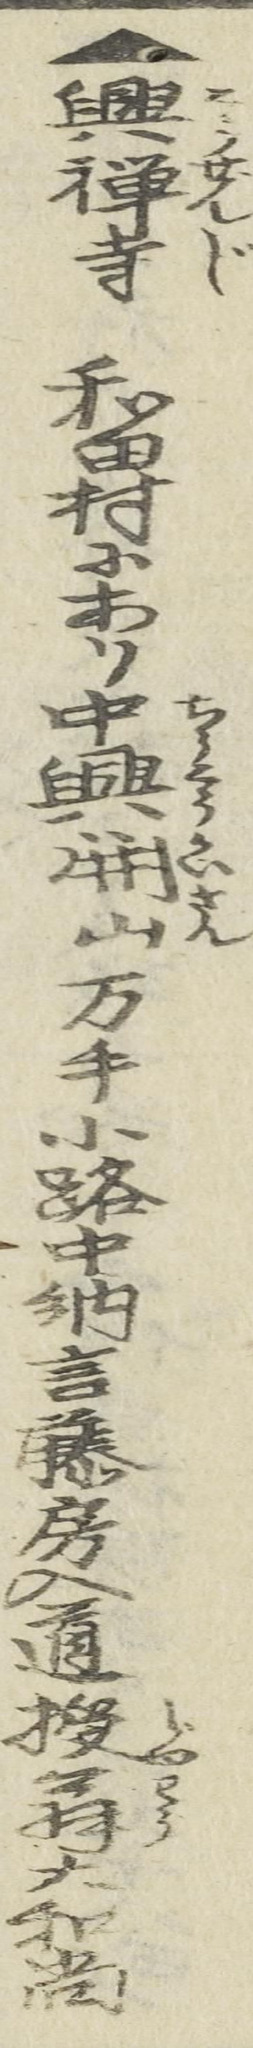▲興禅寺和田村にあり中興開山万手小路中納言藤房入道授翁大和尚
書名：熱海温泉圖彙
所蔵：東京大学地震研究所図書室 Earthquake Research Institute Library, The University of Tokyo, JAPAN
